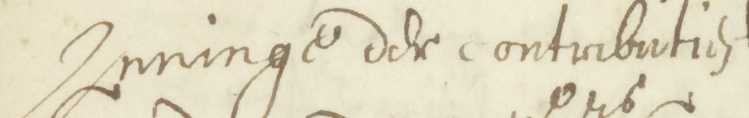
Inninge der contributien
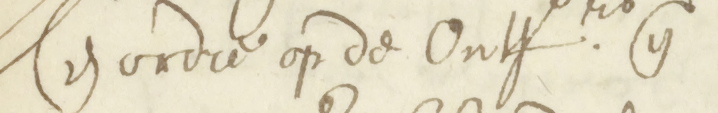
& ordre op de Ontfrs. &
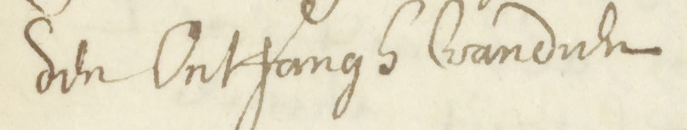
den Ontfangh vandien
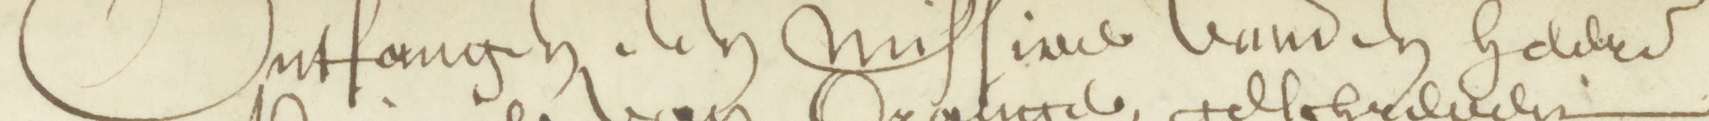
Ontfangen een Missive vanden heere
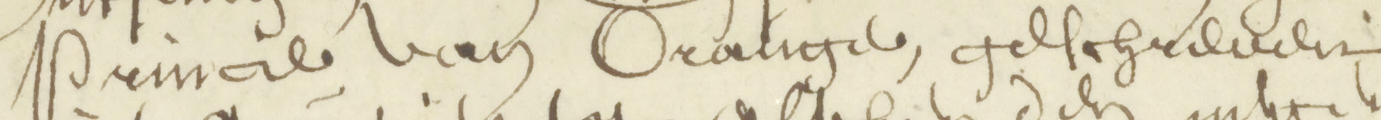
Prince van Orange, geschreven
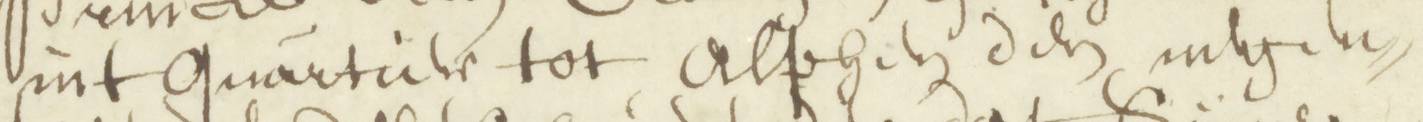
int Quartier tot Alphen den negen„
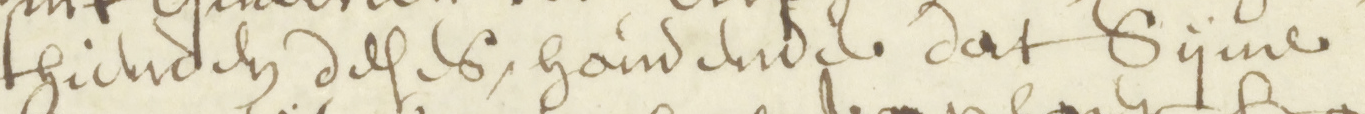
thienden deses, houdende dat Sijne
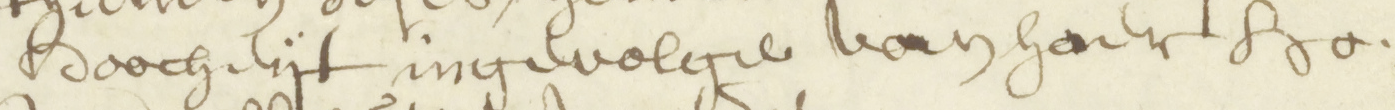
Hoocheijt ingevolge van haer Ho:
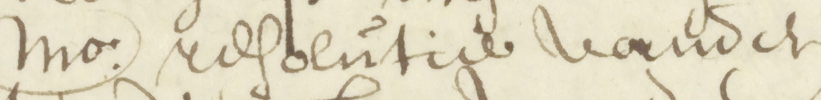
Mo: resolutie vanden - - - ,
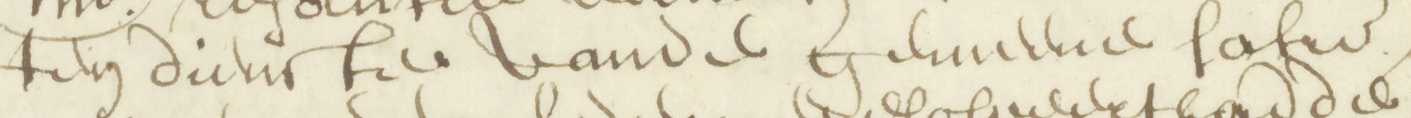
ten dienste vande gemeene sake
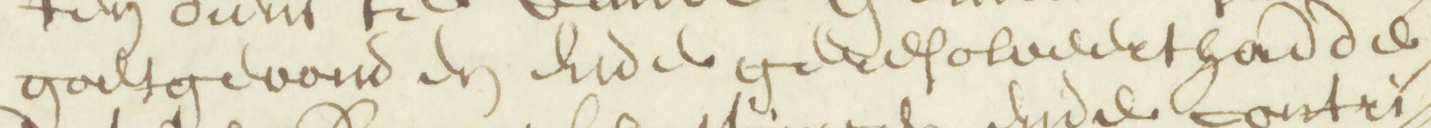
goetgevonden ende geresolveert hadde
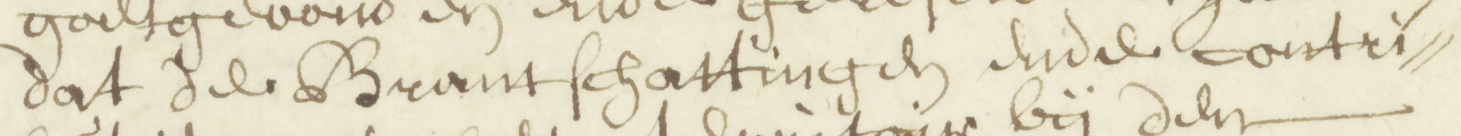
dat de Brantschattingen ende contri„
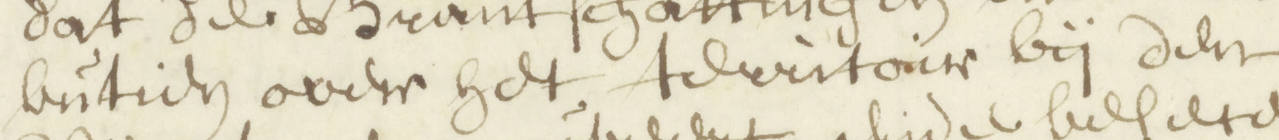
butien over het territoir bij den
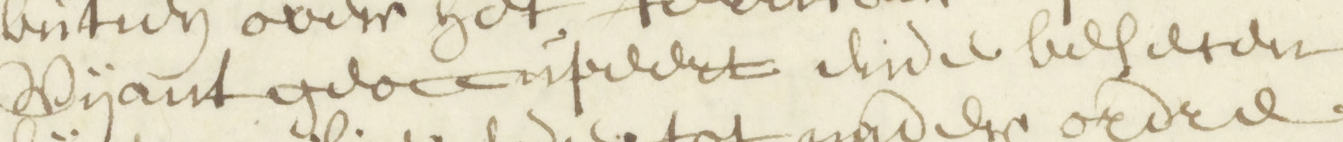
Vijant geoccupeert ende beseten
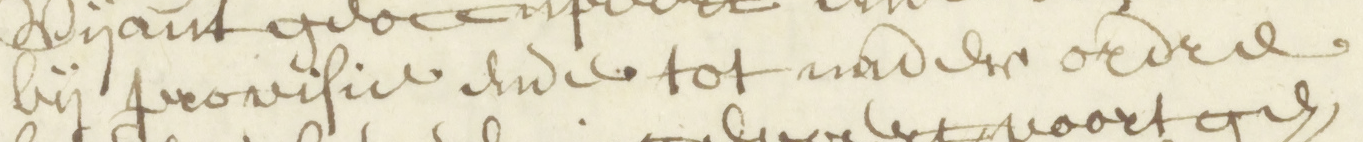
bij provisie ende tot nader ordre
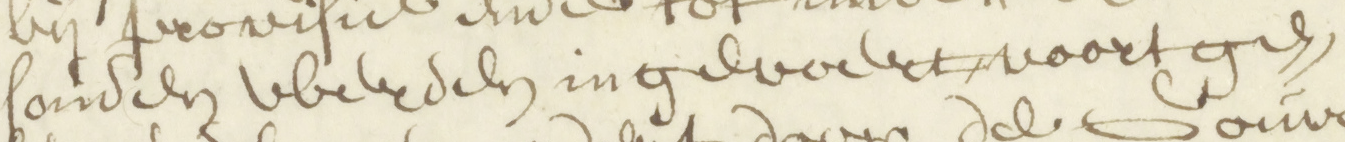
souden werden ingevoert, voortge„
